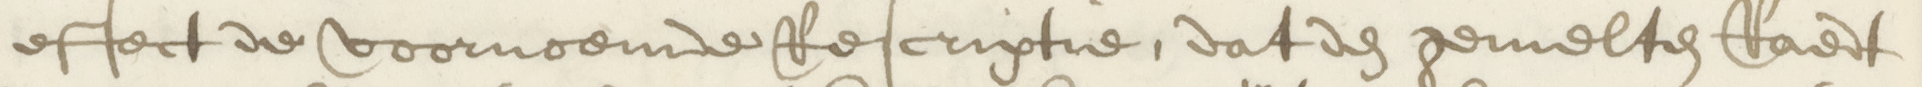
effect de voornoemde Rescriptie, dat den gemelten Raedt
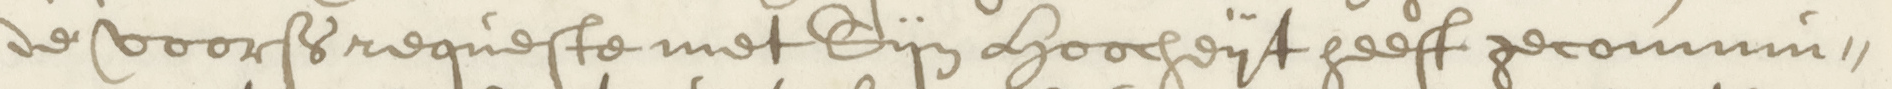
de voors requeste met Sijn Hoocheijt heeft gecommu„
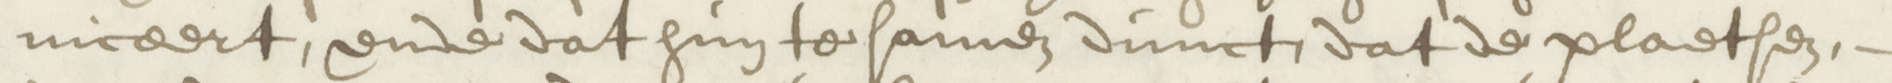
niceert, ende dat hun te samen dunct, dat de plaetsen, -
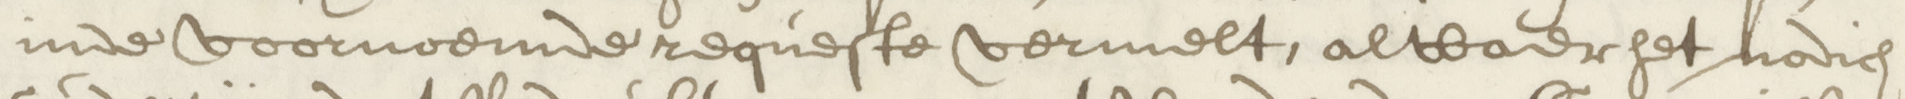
inde voornoemde requeste vermelt, alwaer het nodich
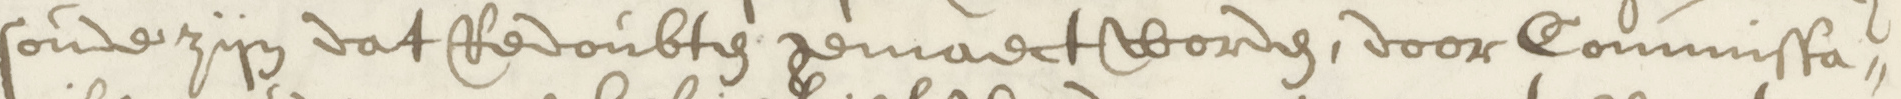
soude zijn dat Redoubten gemaect worden, door Commissa„
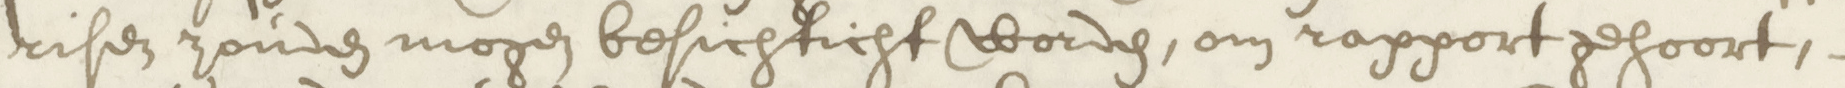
risen zouden mogen besichticht worden, om rapport gehoort,
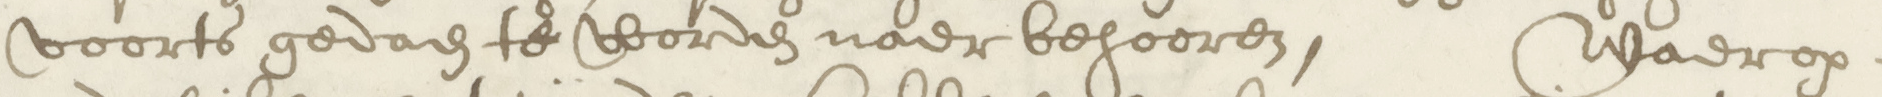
voorts gedaen te worden naer behooren. Waerop
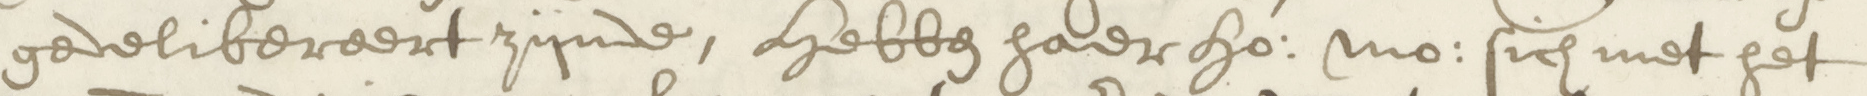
gedelibereert zijnde, hebben haer Ho:Mo: sich met het
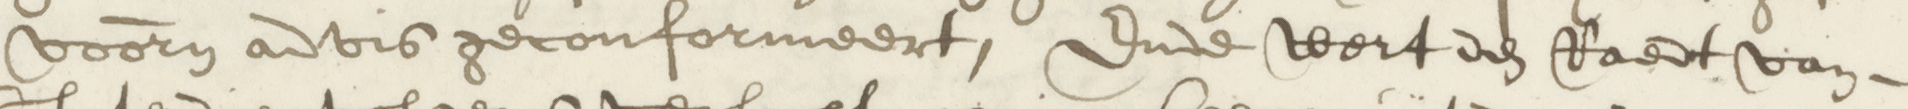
voorn advis geconformeert. Ende wert den Raedt van —
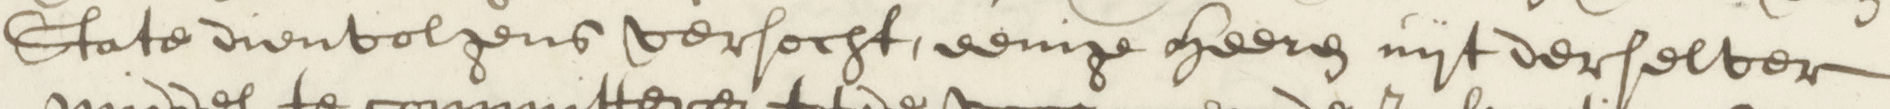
State dienvolgens versocht, eenige heeren uijt derselver
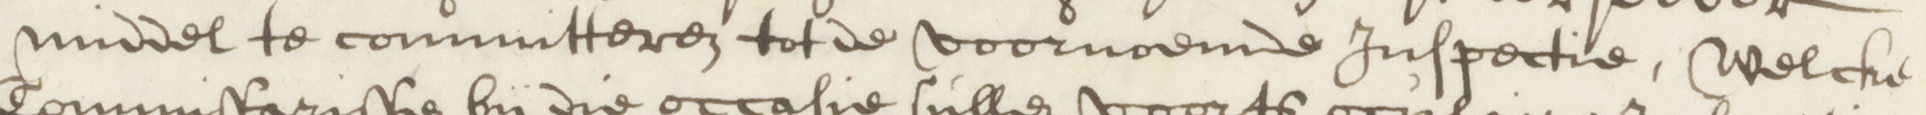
middel te committeren tot de voornoemde Inspectie, Welcke
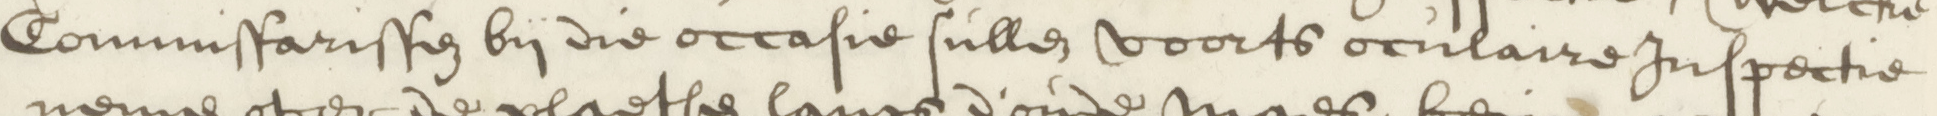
Commissarissen bij die occasie sullen voorts oculaire Inspectie
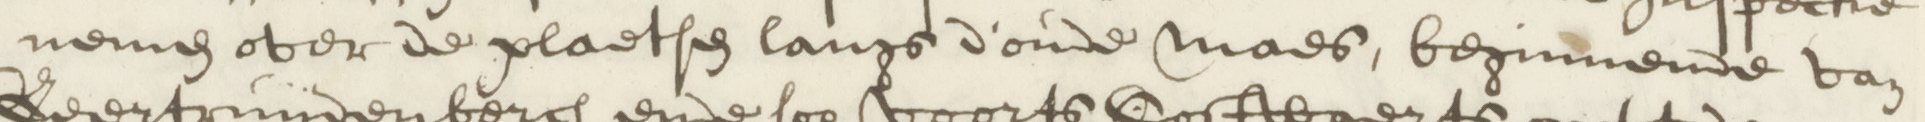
nemen over de plaetsen langs d'oude maes, beginnende van
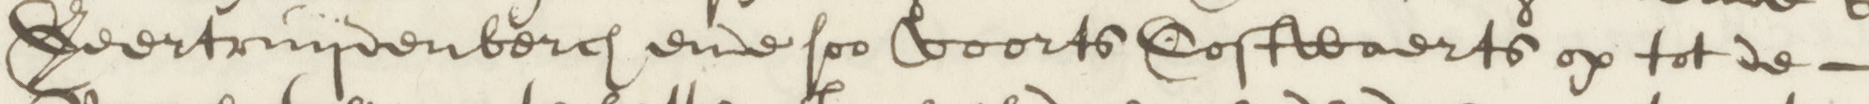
Geertruijdenberch ende soo voorts Oostwaerts op tot de —
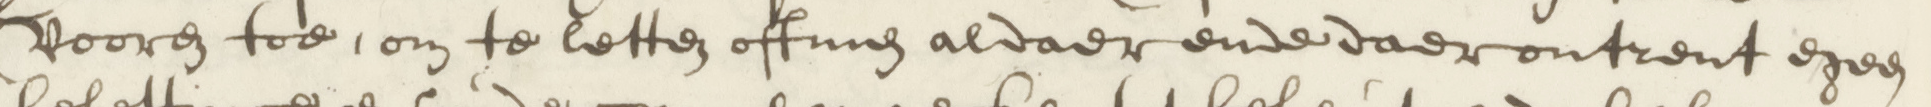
Vooren toe, om te letten offmen aldaer ende daerontrent egeen
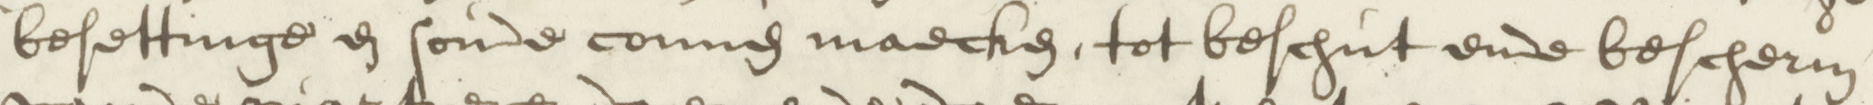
besettinge en soude connen maecken, tot beschut ende bescherm
